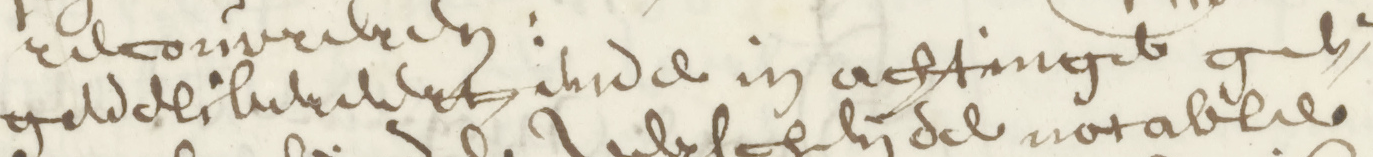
gedelibereert, ende in achtinge ge„
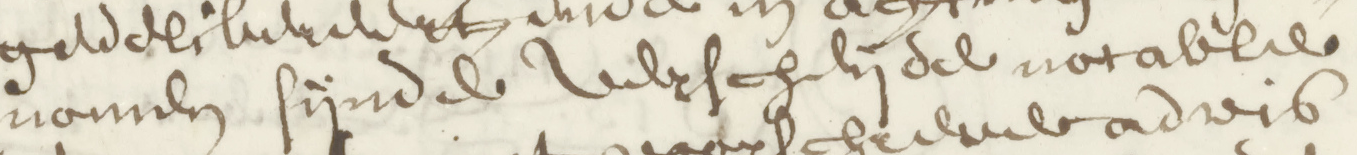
nomen sijnde, verscheijde notable
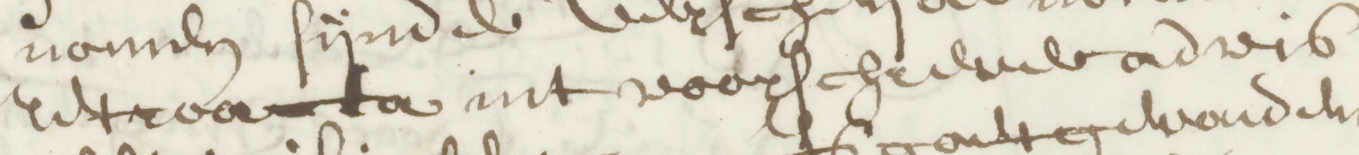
retroacta int voorschreve advis
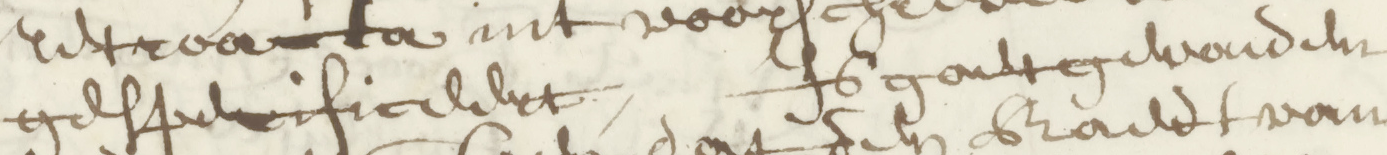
gespecificeert, Is goetgevonden
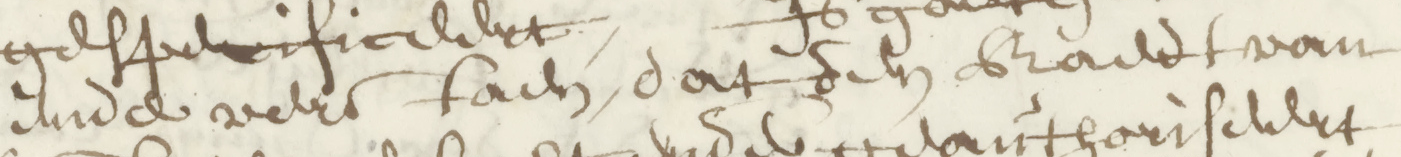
ende verstaen, dat den Raedt van
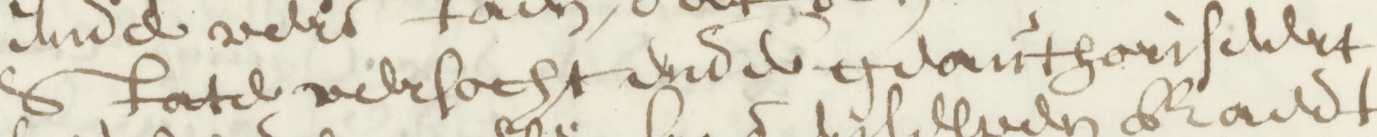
State versocht ende geauthoriseert
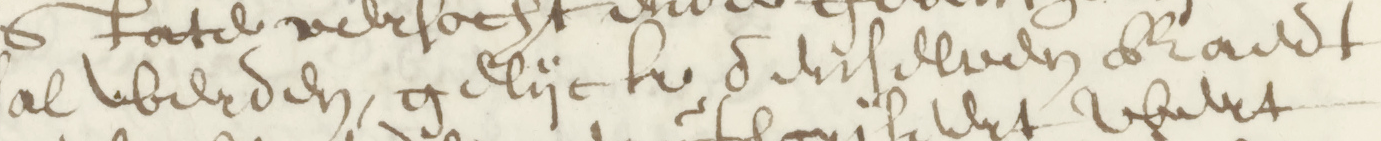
sal werden, gelijck denselven Raedt
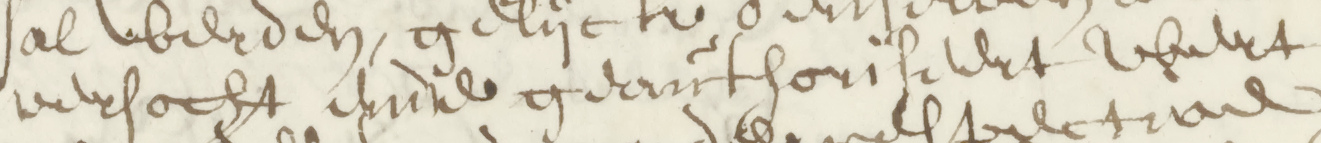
versocht ende geauthoriseert wert
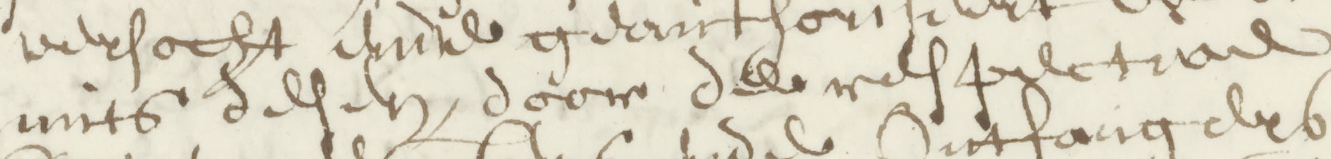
mits desen, door de respective
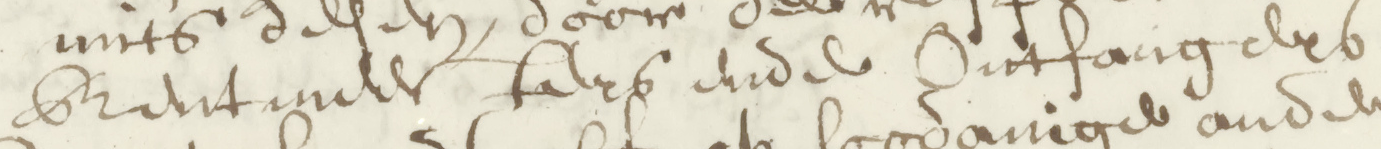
Rentmeesters ende Ontfangers
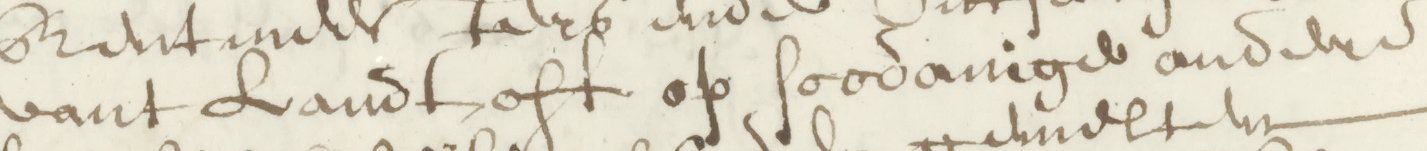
vant Landt, off op soodanige andere
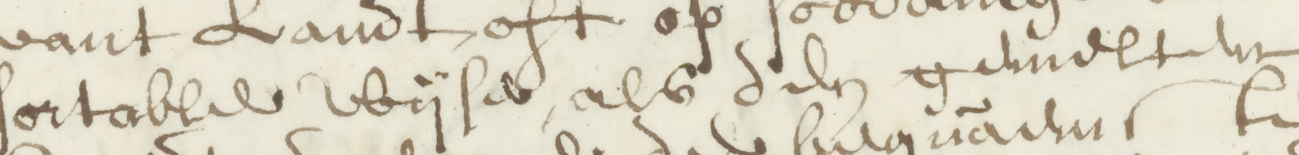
sortable wijse, als den gemelten
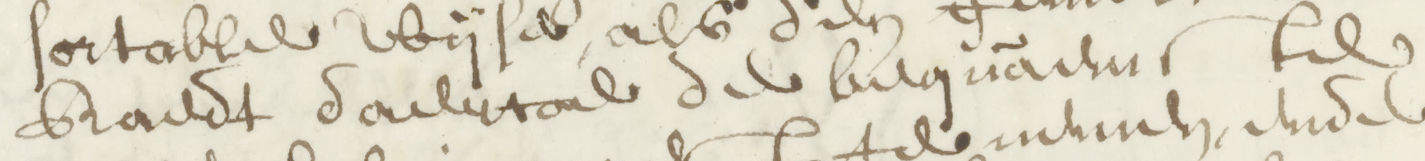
Raedt daertoe de bequaemste
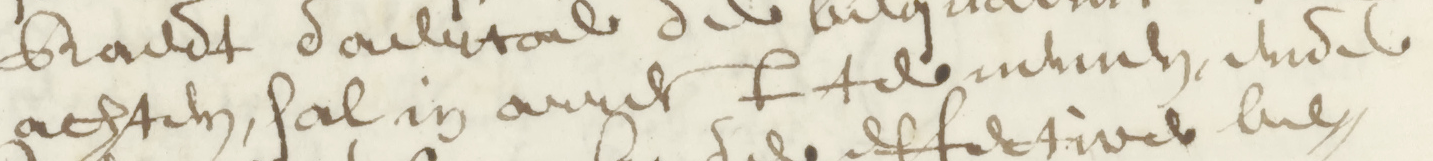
achten, sal in arrest te nemen, ende
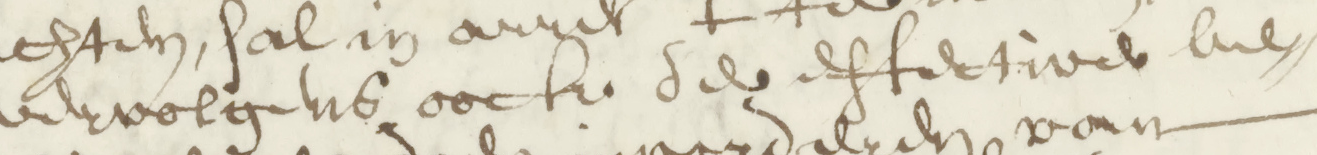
vervolgens oock de effective be„
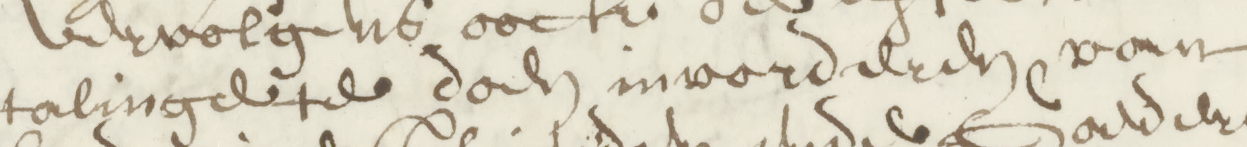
talinge te doen invorderen van
